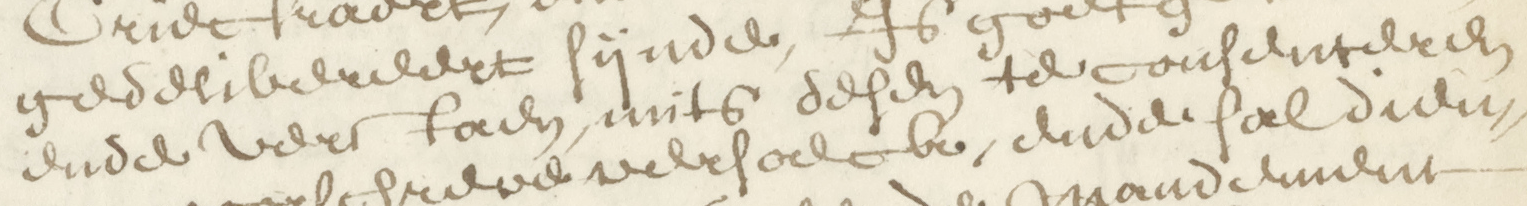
ende verstaen, mits desen te consenteren
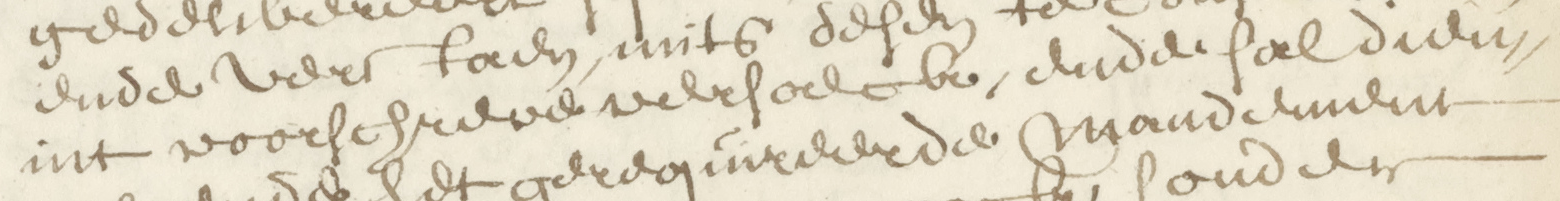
int voorschreve versoeck, ende sal dien„
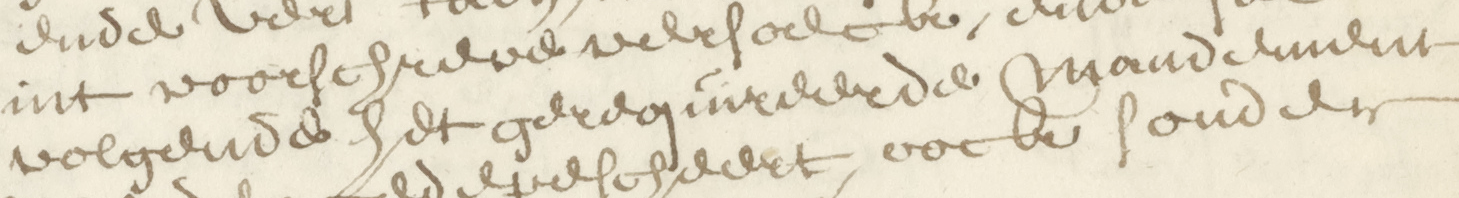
volgende het gerequireerde mandement
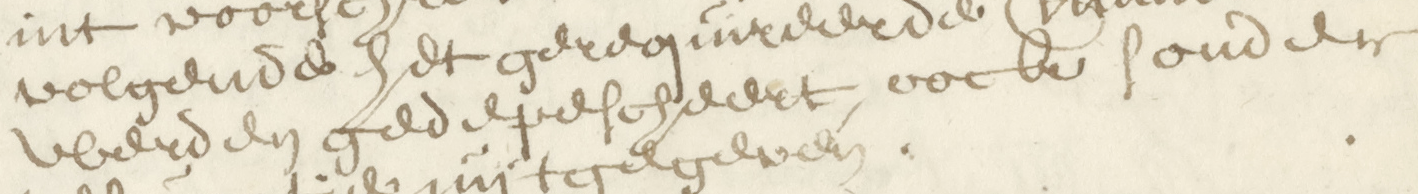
werden gedepescheert oock sonder
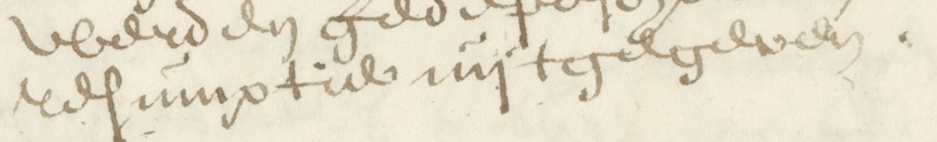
resumptie uijtgegeven.
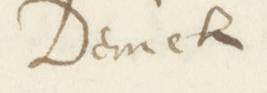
Denick
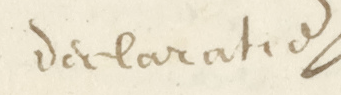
declaratie.
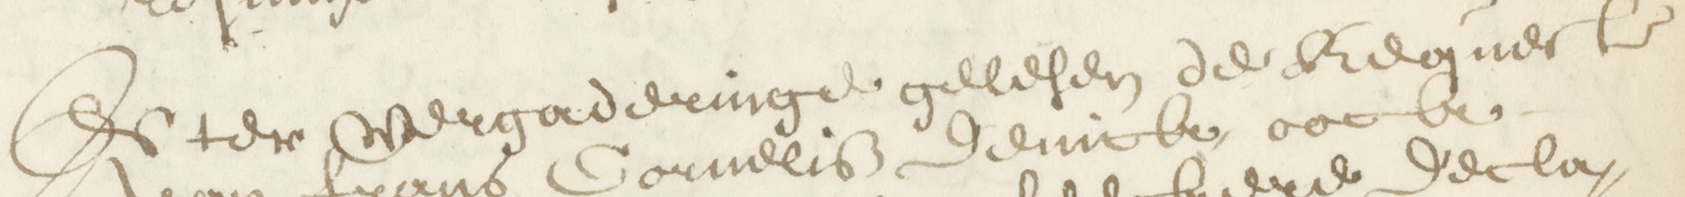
Is ter vergaderinge gelesen de requeste
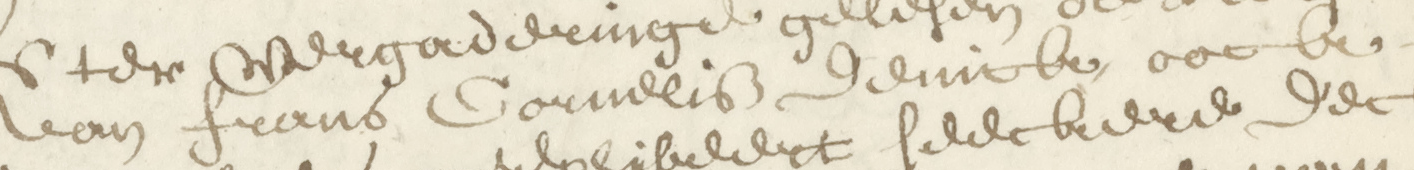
van Frans Cornelis Denick, oock
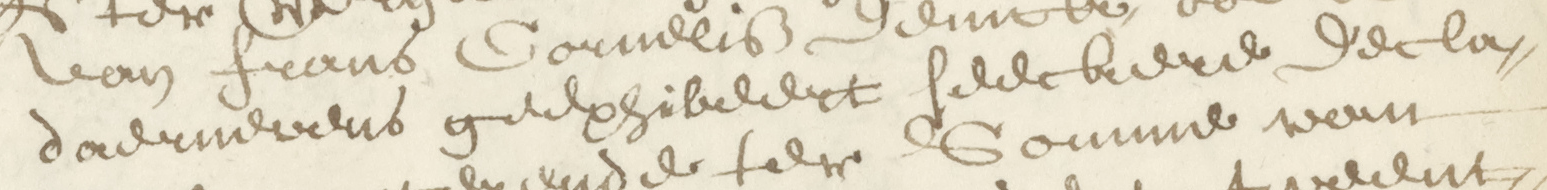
daernevens geexhibeert seeckere Decla„
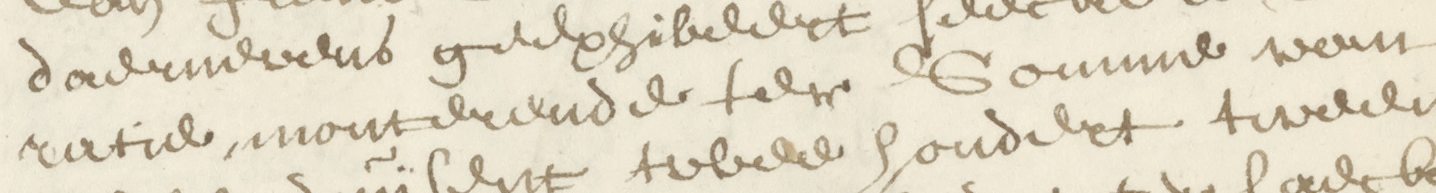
ratie, monterende ter somme van
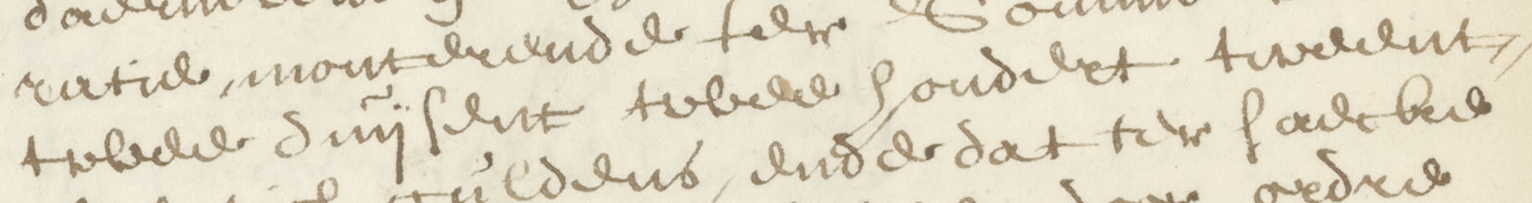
twee duijsent twee hondert tweent,
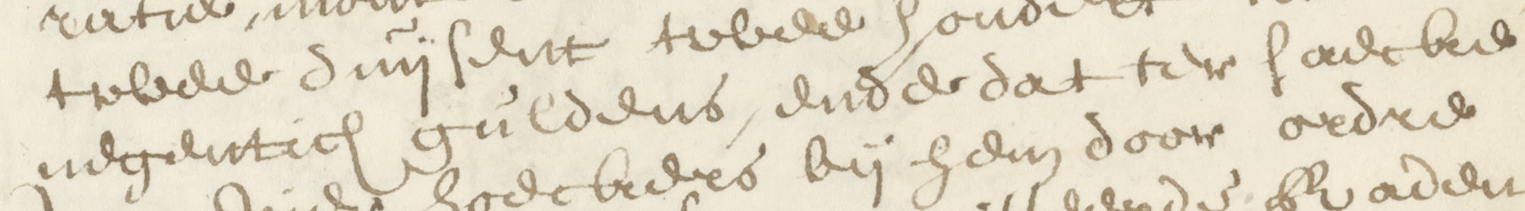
negentich guldens, ende dat ter saecke
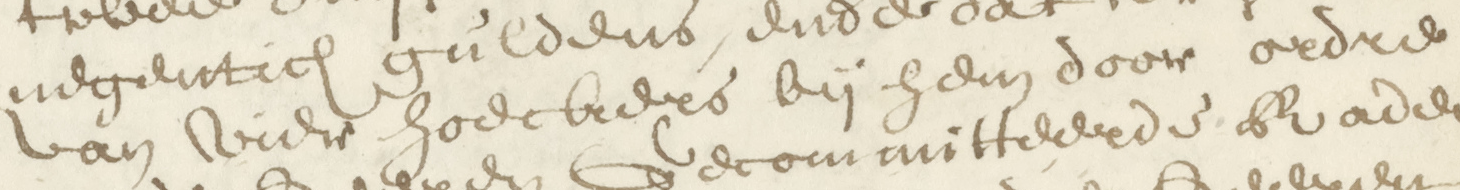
van vier hoeckers bij hem door ordre
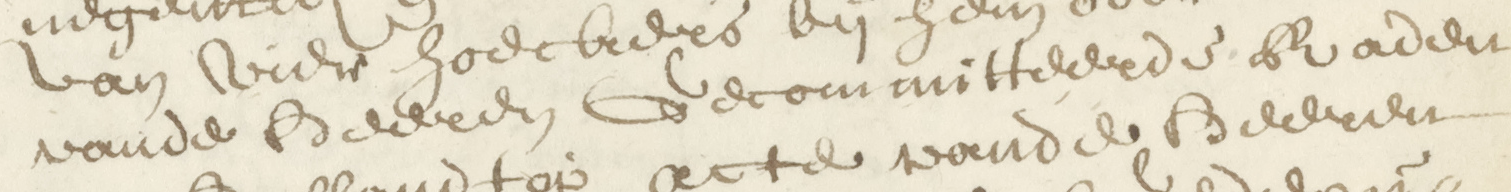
vande Heeren Gecommitteerde Raden
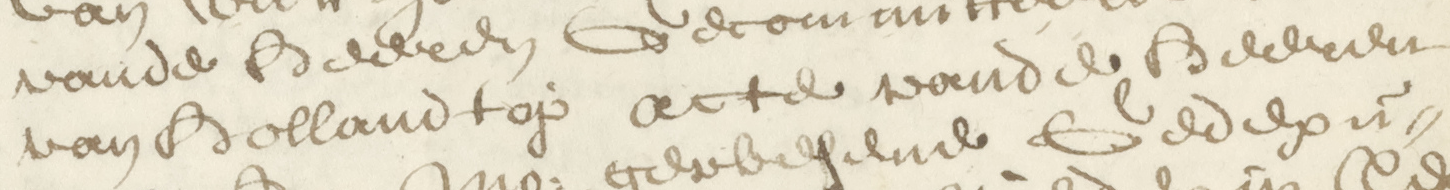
van Hollandt op acte vande Heeren
